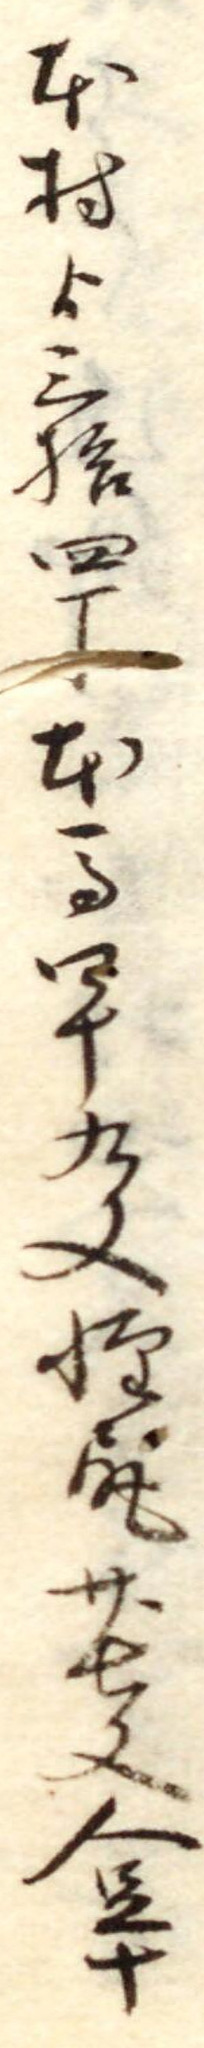本村ゟ三拾四丁本馬四十九文軽尻廿七文人足十
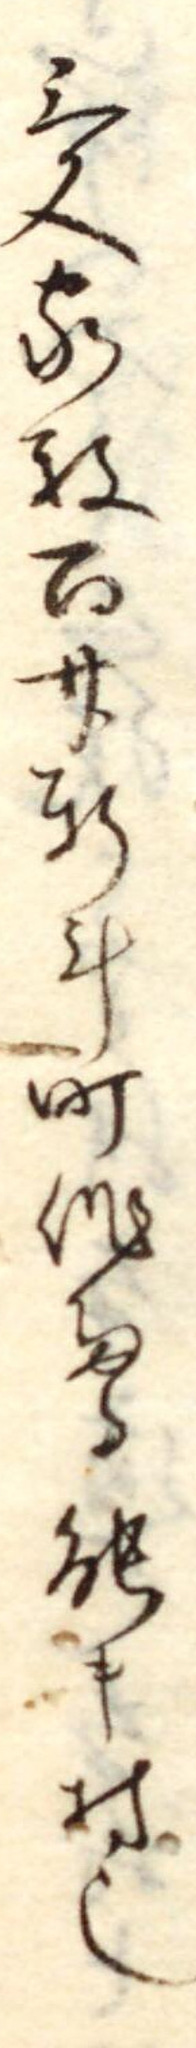正院三文家数百廿軒斗町作たる能き村也
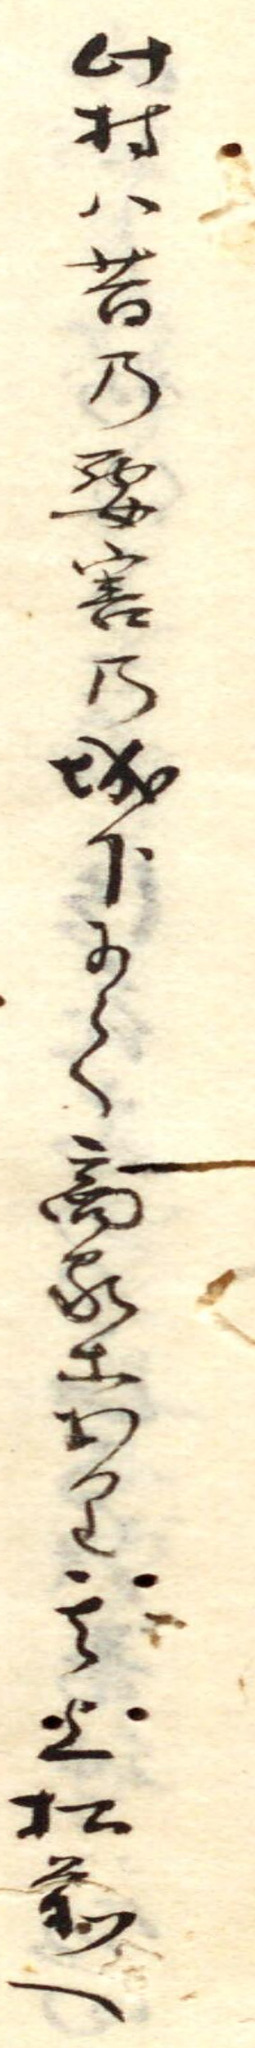此村は昔の要害の城下にて商家等なり其上松前へ
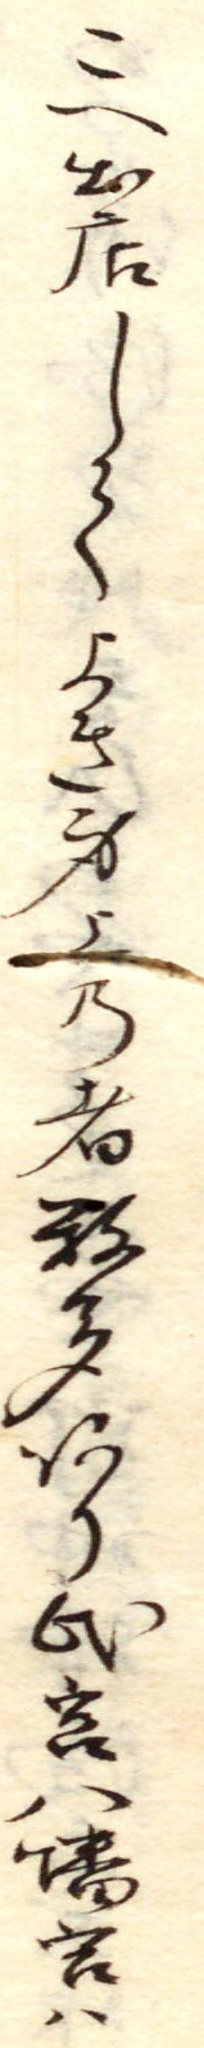こへ出店してよき身上の者数多あり氏宮八幡宮は
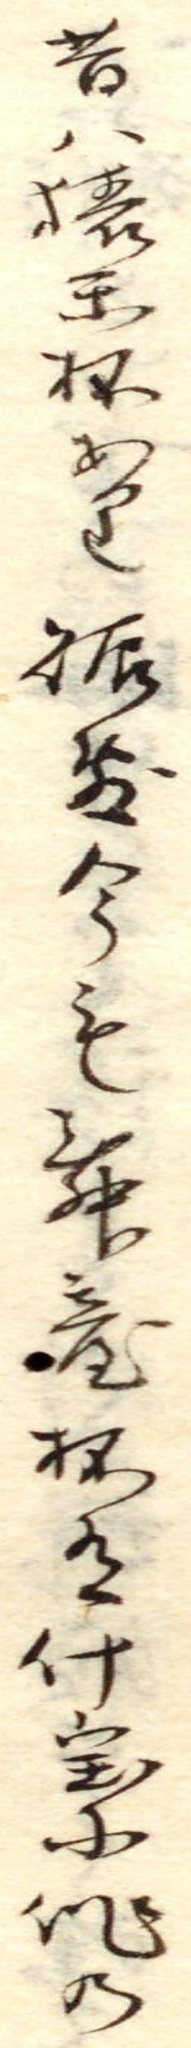昔は抔あり賑敷今も舞台抔有什宝に作の
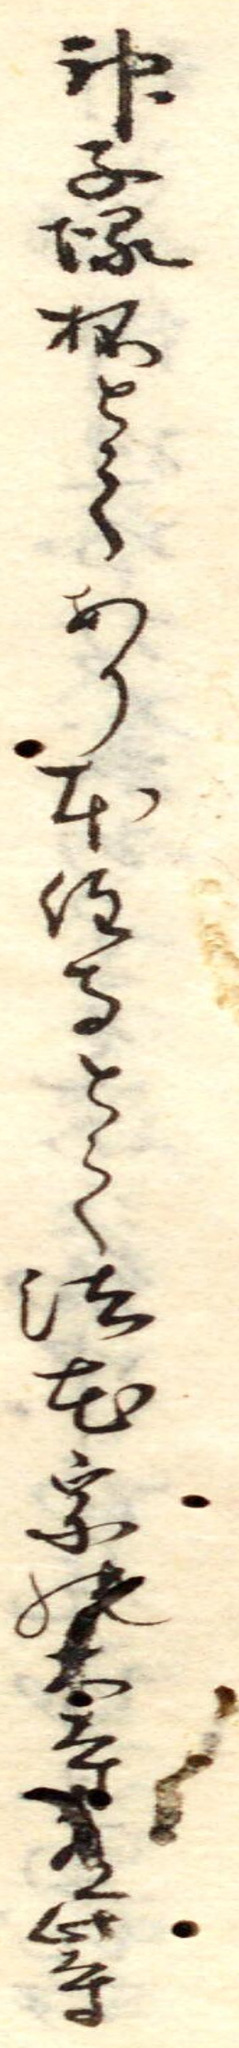神子塚抔とてあり本住寺とて法華宗の大寺有此寺
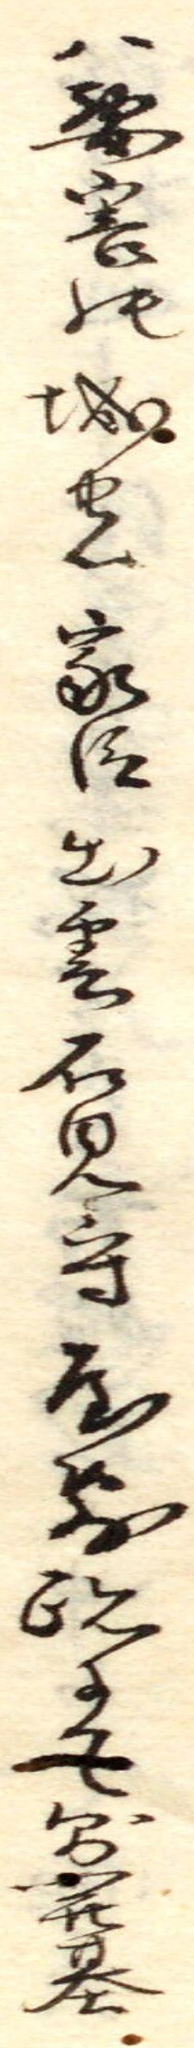は要害の城の家臣出雲石見守屋敷跡にて則開基
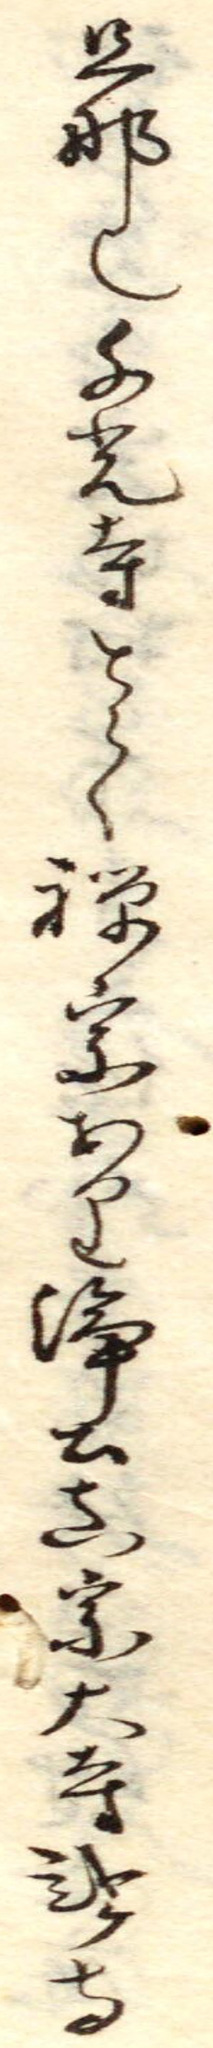旦那也千光寺とて禅宗あり浄土真宗大寺弐ヶ寺
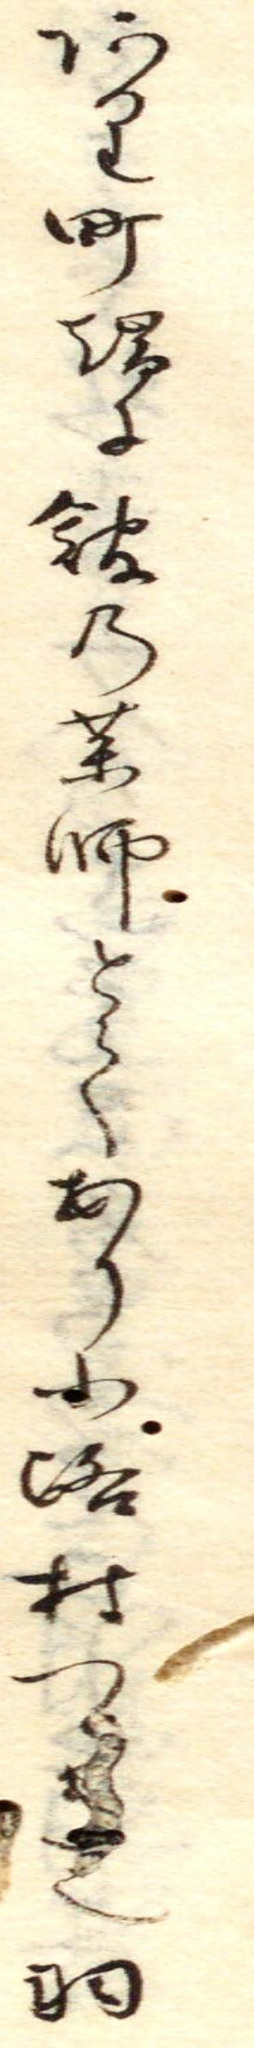あり町端に館の薬師とてあり小路村つ也羽

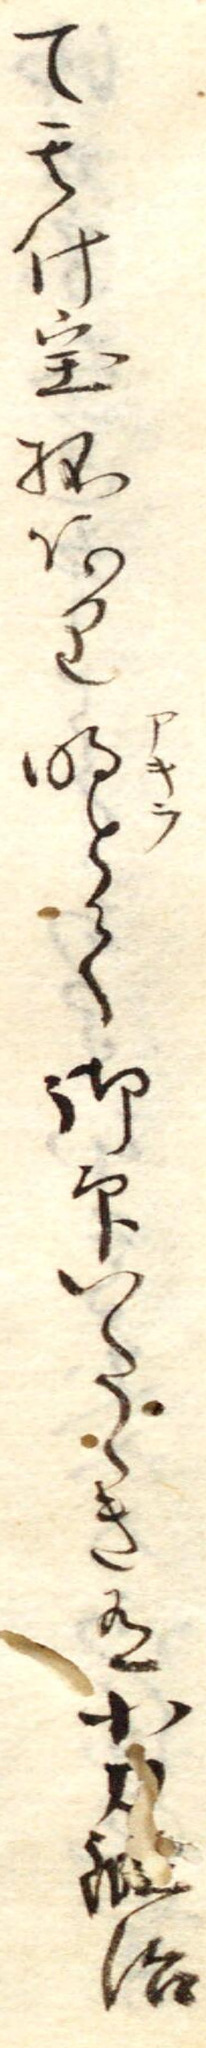て其什宝あり明とて御印いたゝき有小刀鍛冶
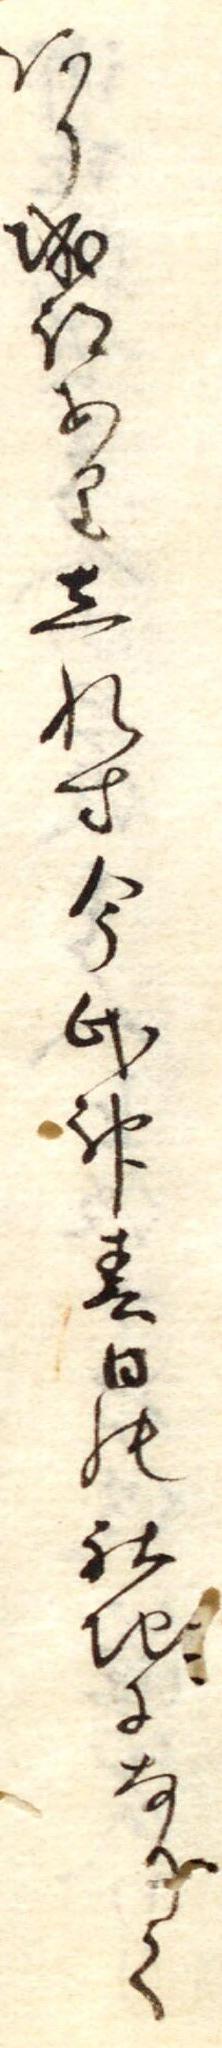あり城跡ありしれす今氏神春日の社地になりて
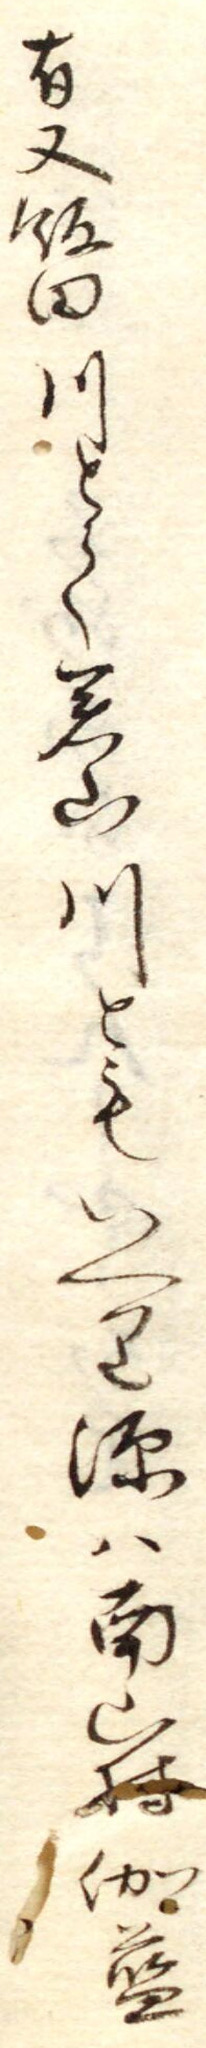有又飯田川とて若山川ともいへり源は南山村伽藍
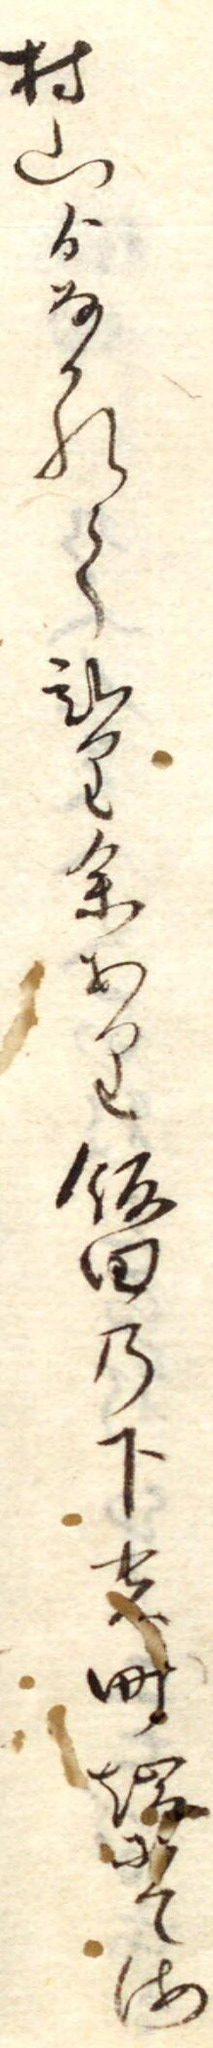村山ゟなかれて弐里余あり飯田の下の町端にて海
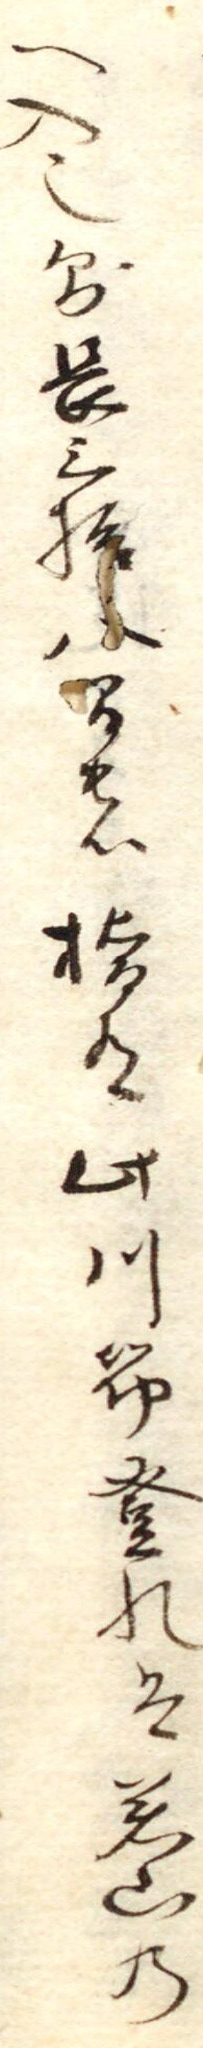へ入也則長三拾八間の橋有此川筋登れは若山の
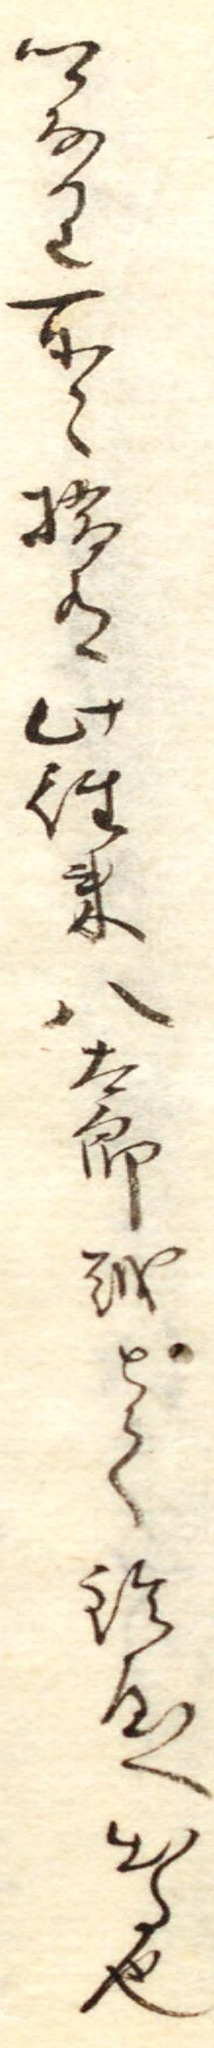郷なり所々橋有此往来八太郎越とて鈴屋へ出る也
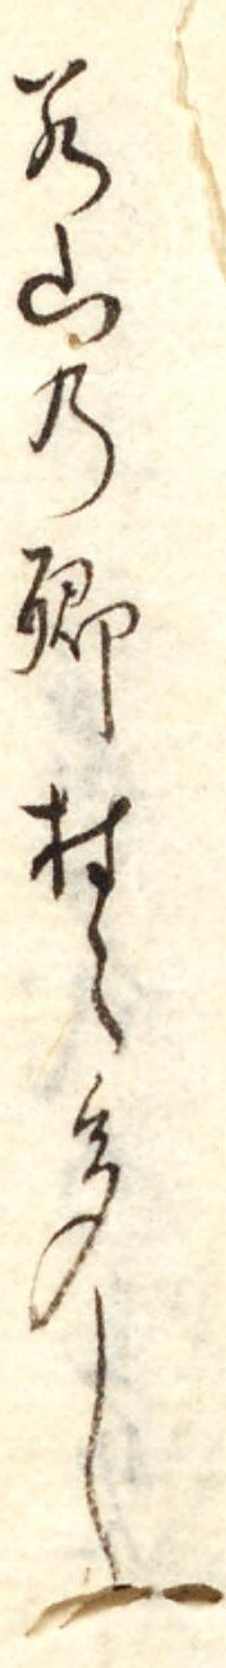若山の郷村々多し
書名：能登名跡誌
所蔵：Ishikawa Prefectural Library
